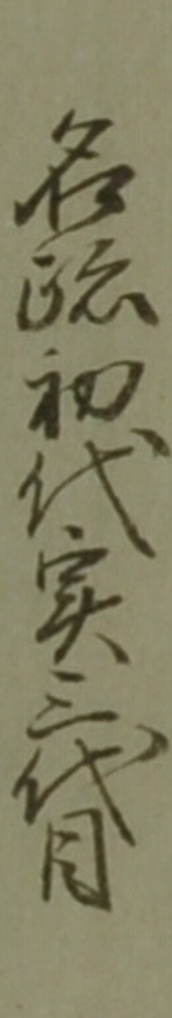名跡初代実三代目
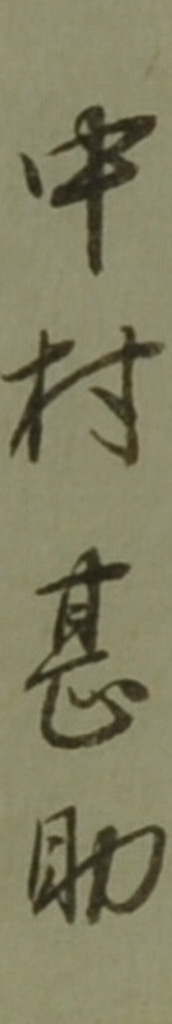中村甚助
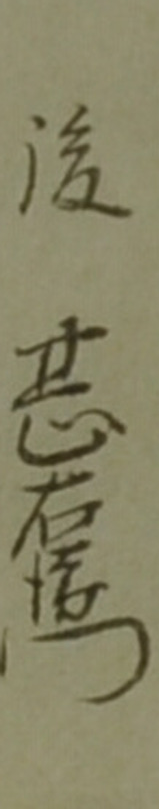後甚右衛門
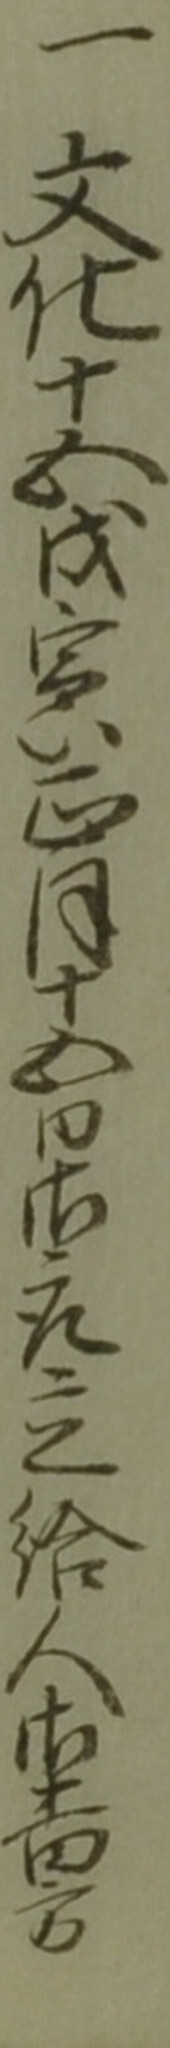一文化十五戊寅正月十五日御取立給人御番方
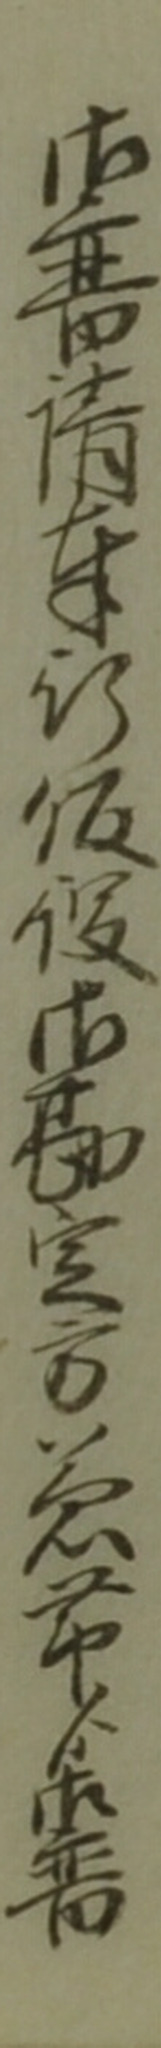御普請奉行仮役御勘定方兼帯ゟ御普
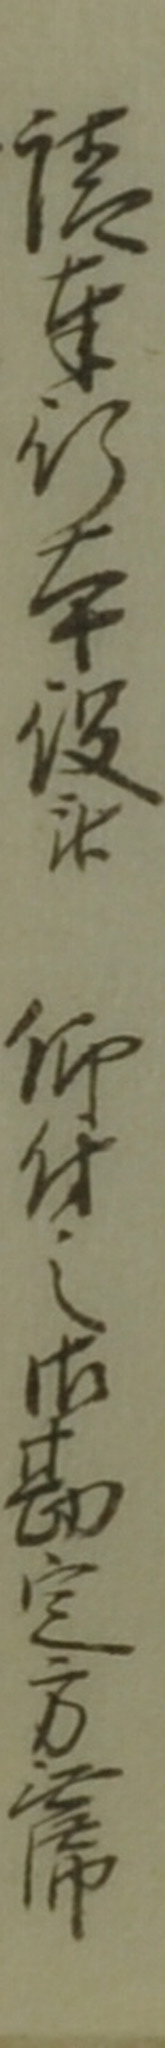請奉行本役被仰付之御勘定方無滞
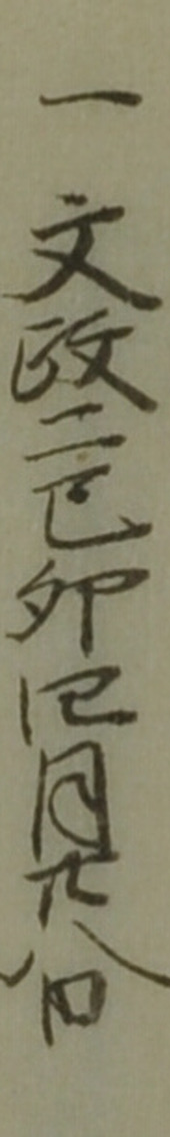一文政二己卯四月廿八日
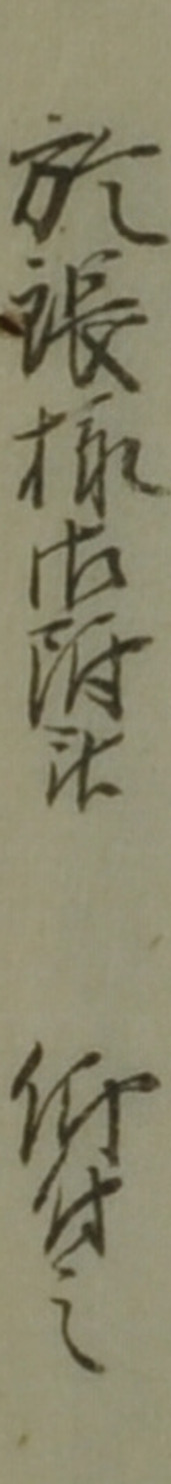御鋹様御附被仰付之
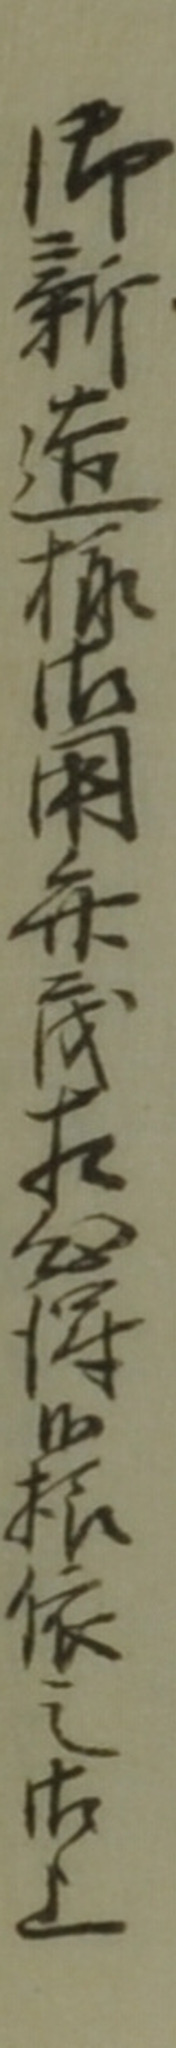御新造様御用弁茂相心得御様依之御上
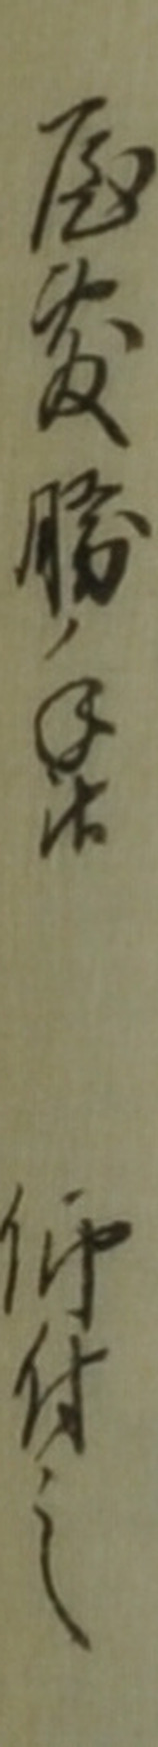屋敷勝手被仰付之
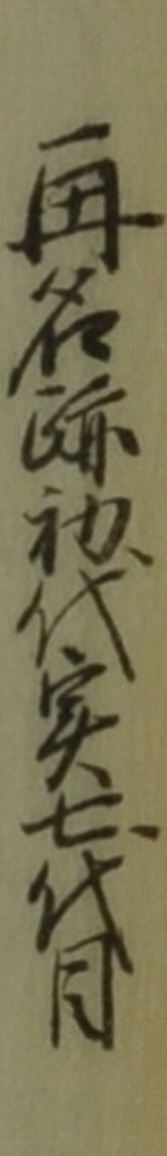再名跡初代実七代目
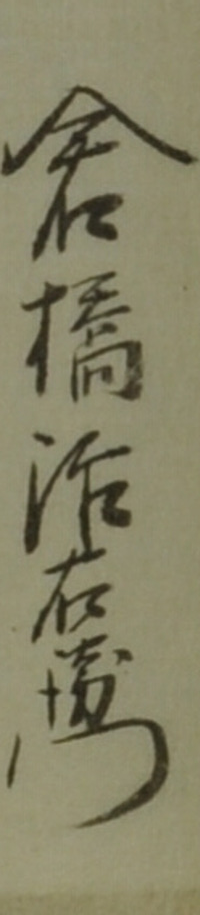倉橋治右衛門
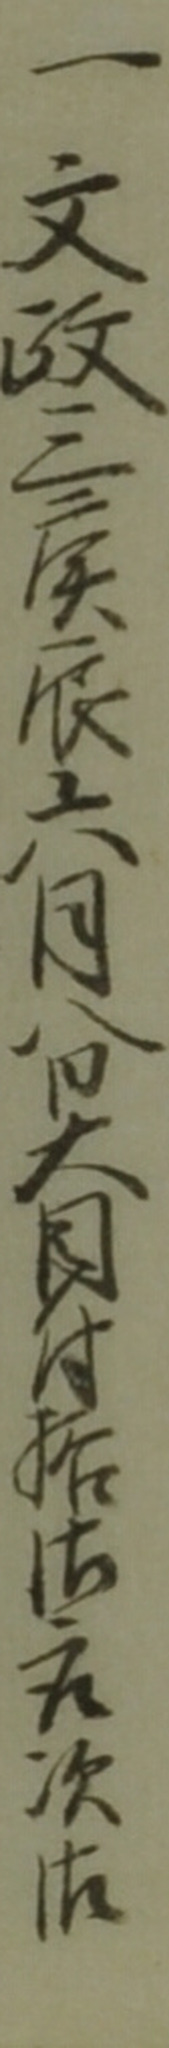一文政三庚辰六月八日大目付格御取次御
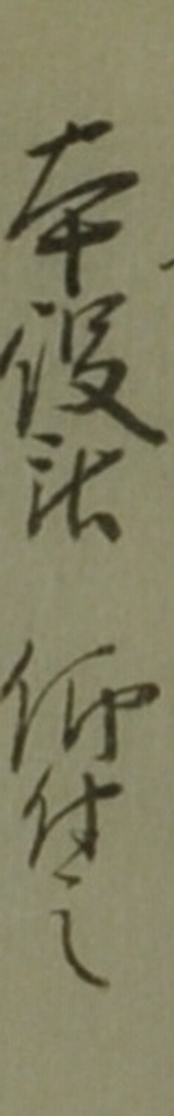本役被仰付之
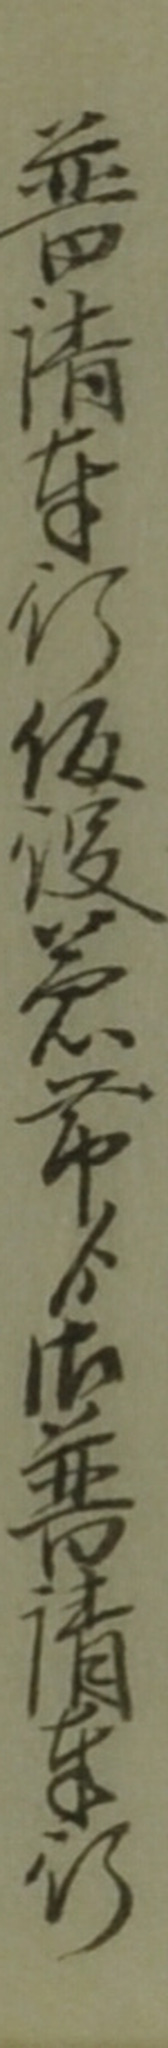普請奉行仮役兼帯ゟ御普請奉行
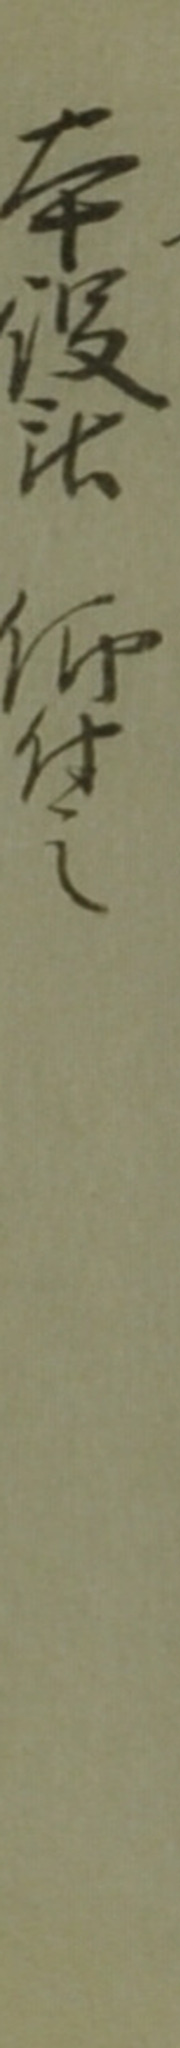本役被仰付之
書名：諸御役代々録（六）
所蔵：伊那市立高遠町図書館・合同会社AMANE
